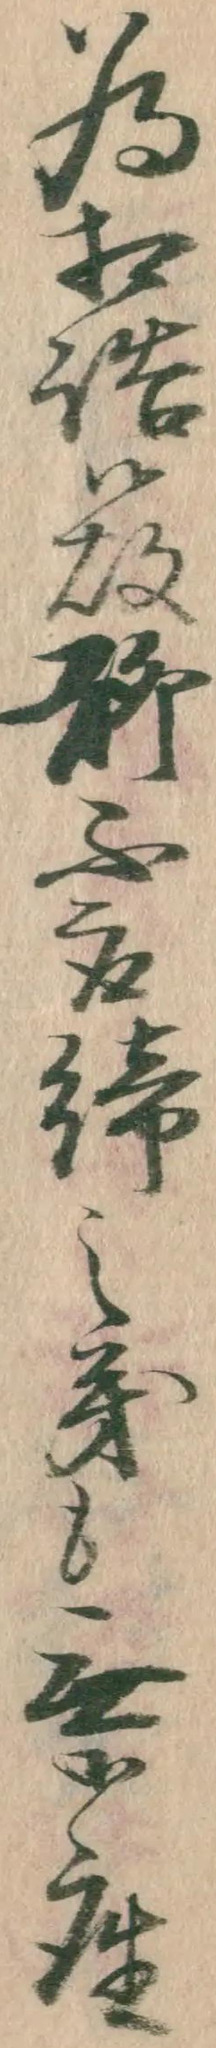為相詰候故聊不取締之儀も無御座
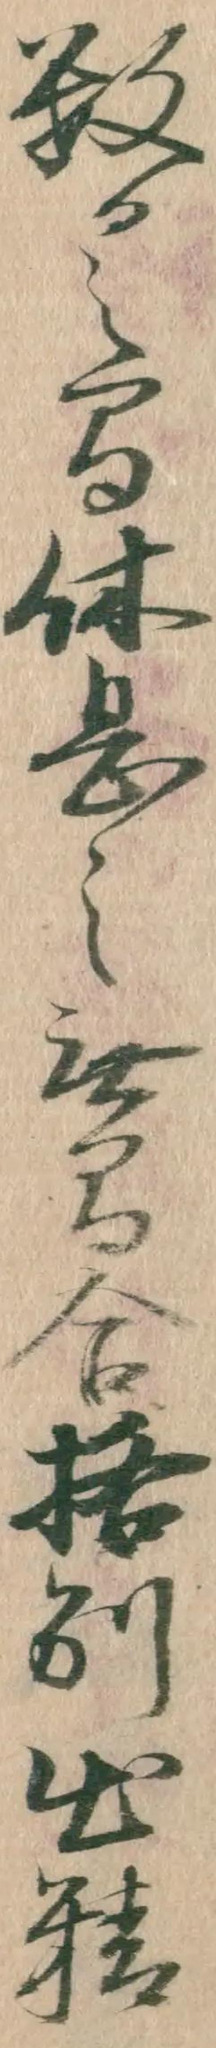数日之間休息之無間合格別出精
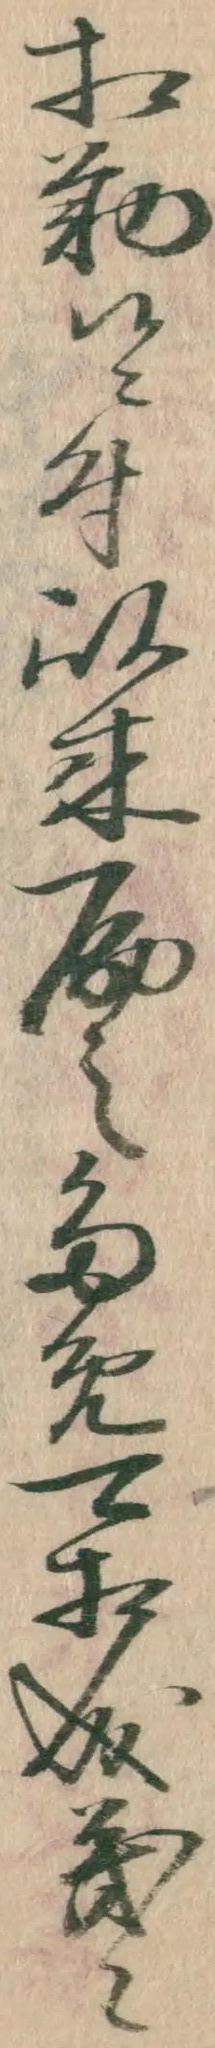相勤候ニ付以来励之ため可相成儀ニ
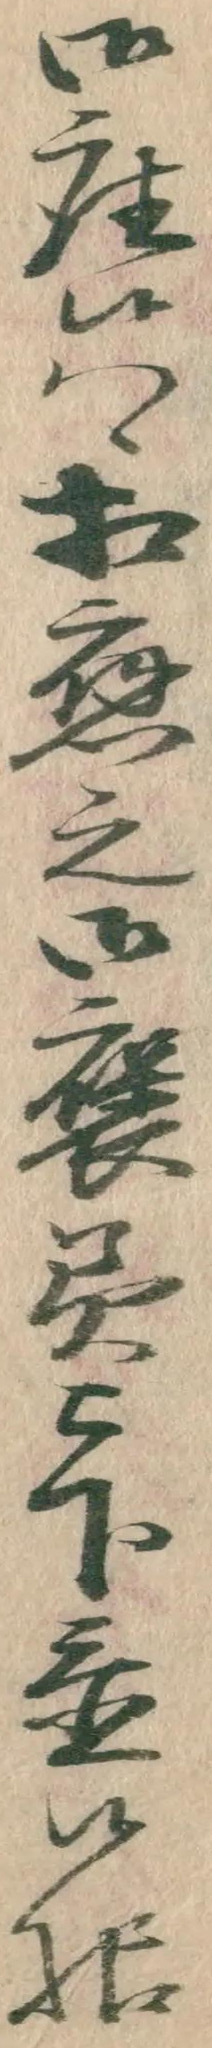御座候ハヽ相応之御褒美被下置候様
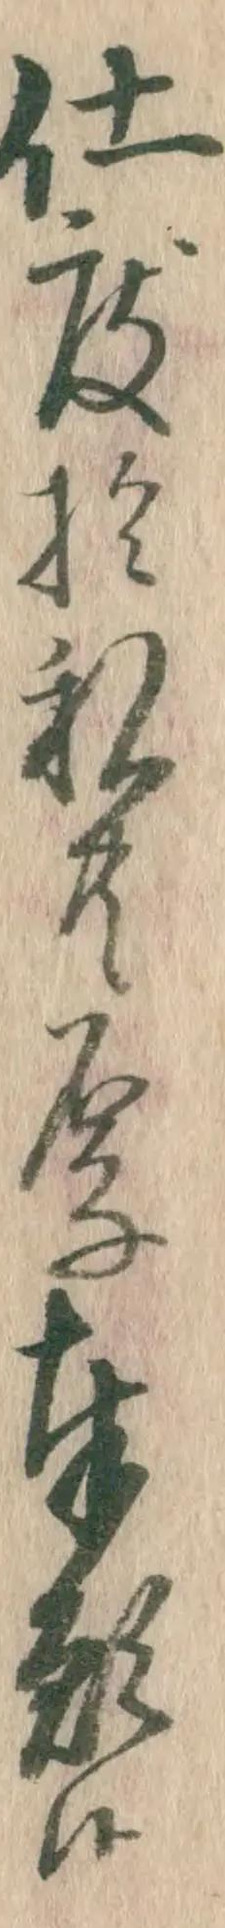仕度於私共厚奉願候

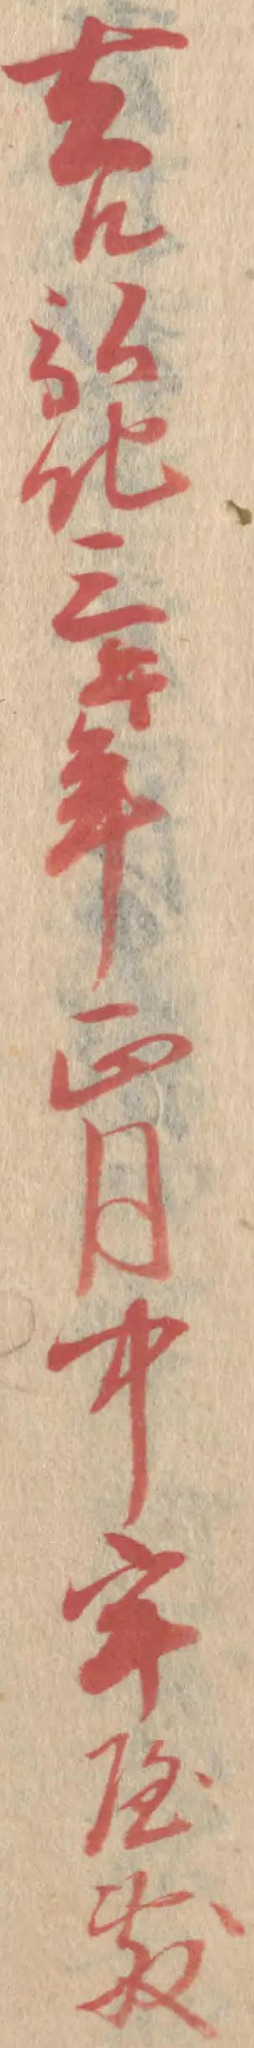「去ル弘化三午年正月中牢屋敷
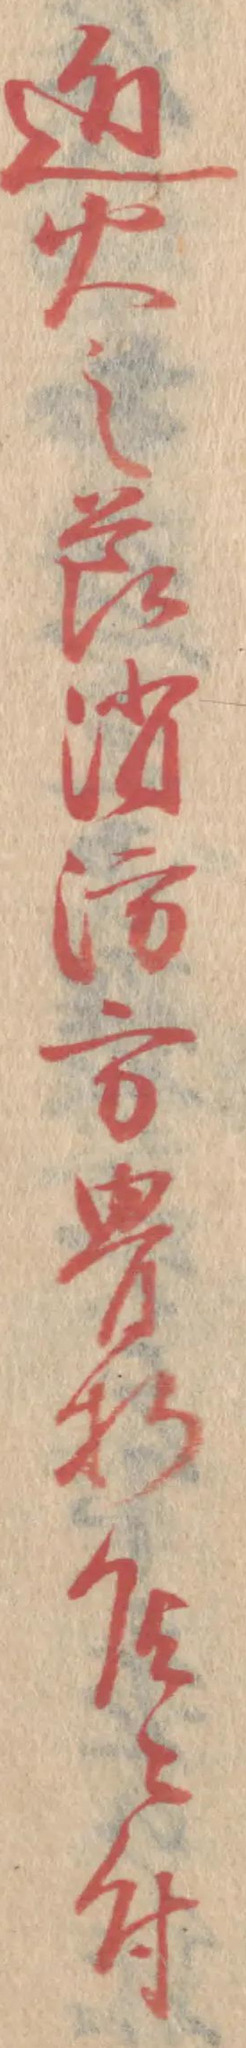近火之節消防方骨折候ニ付
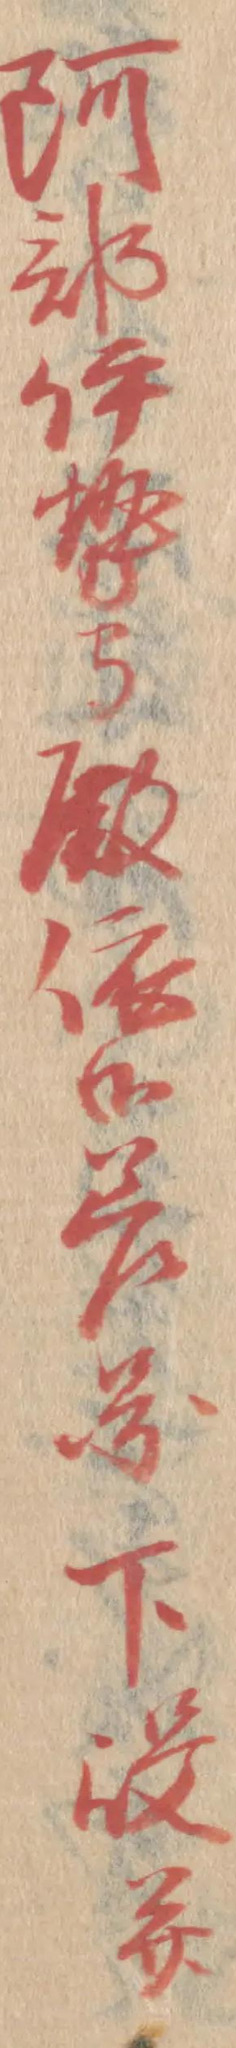阿部伊勢守殿依御指図下役幷
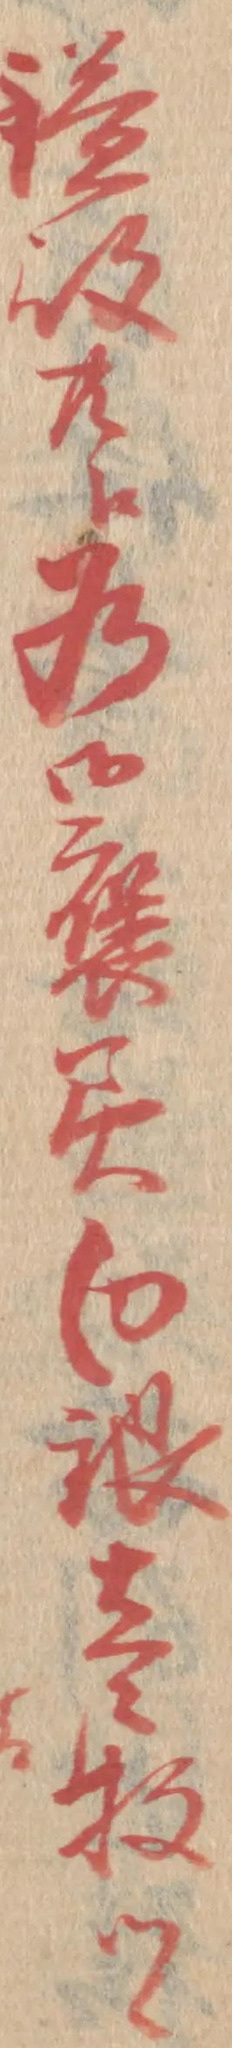鎰役共え為御褒美白銀壱枚ツヽ
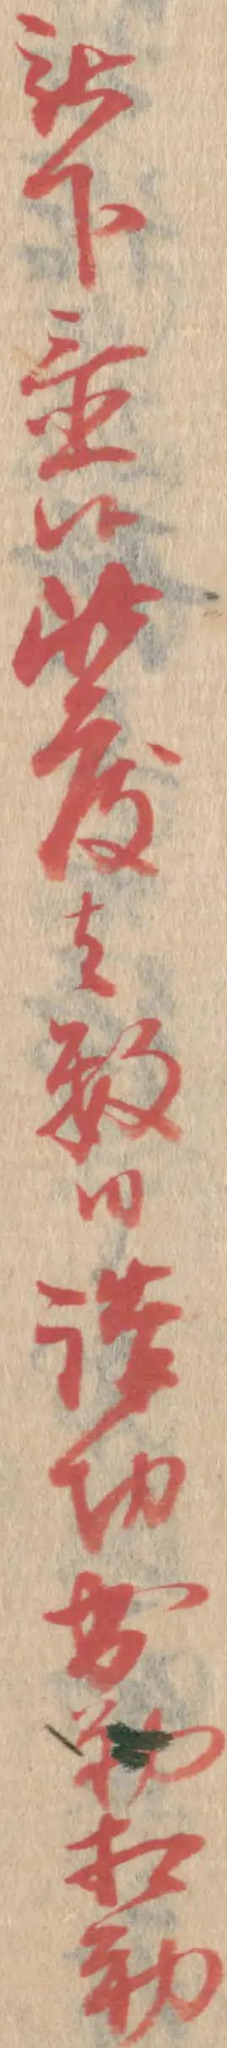被下置候此度は数日詰切出精相勤
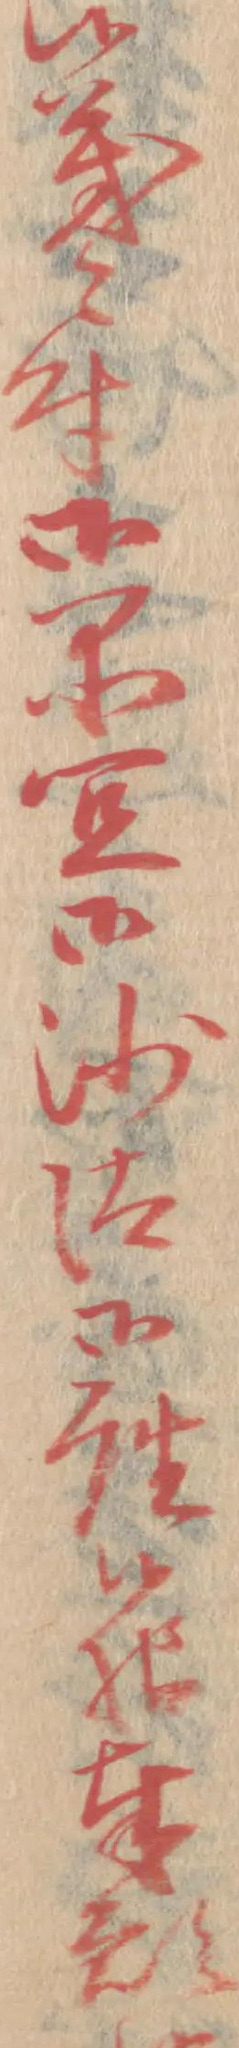候義ニ付御品宜御沙汰御座候様奉願候」
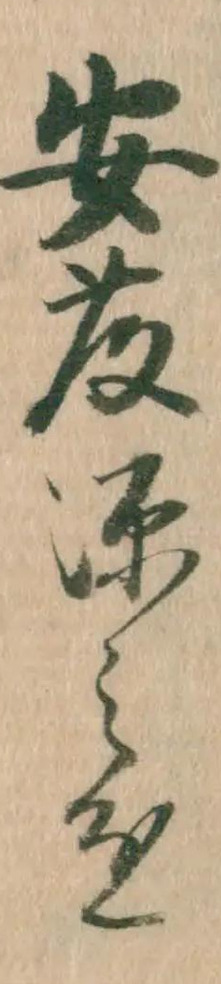安藤源之進
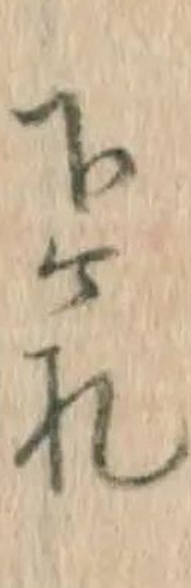下ケ札
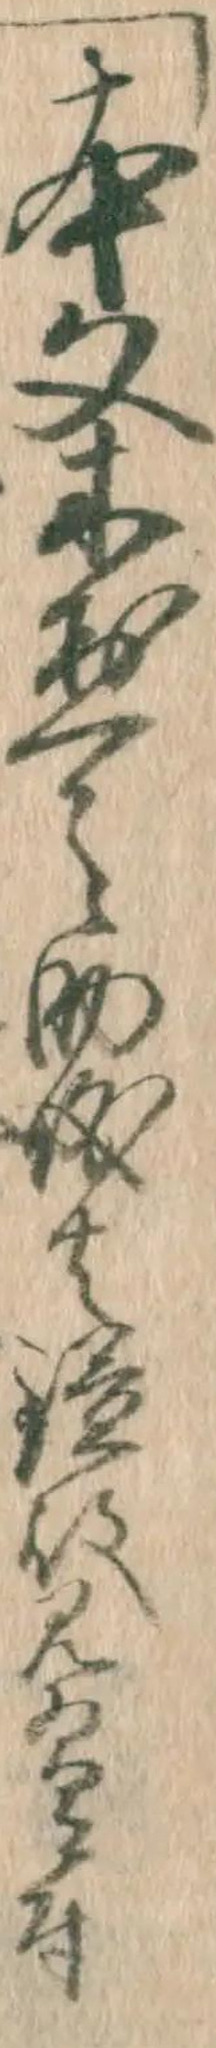┌本文木村一之助儀は鎰役見習ニ付
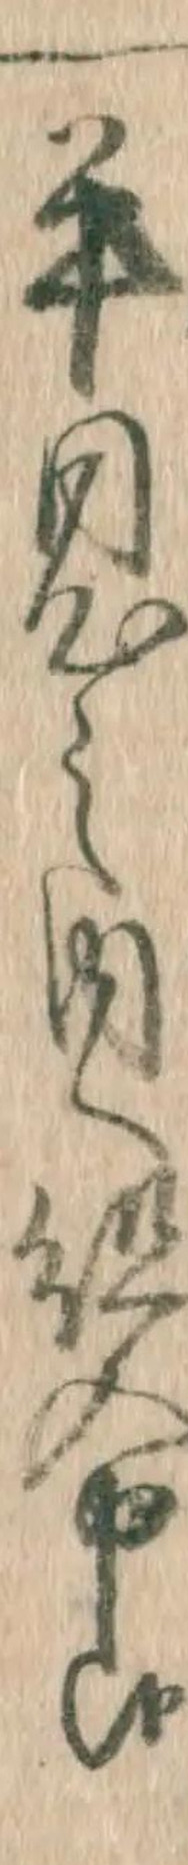└平同心之内へ組入申候

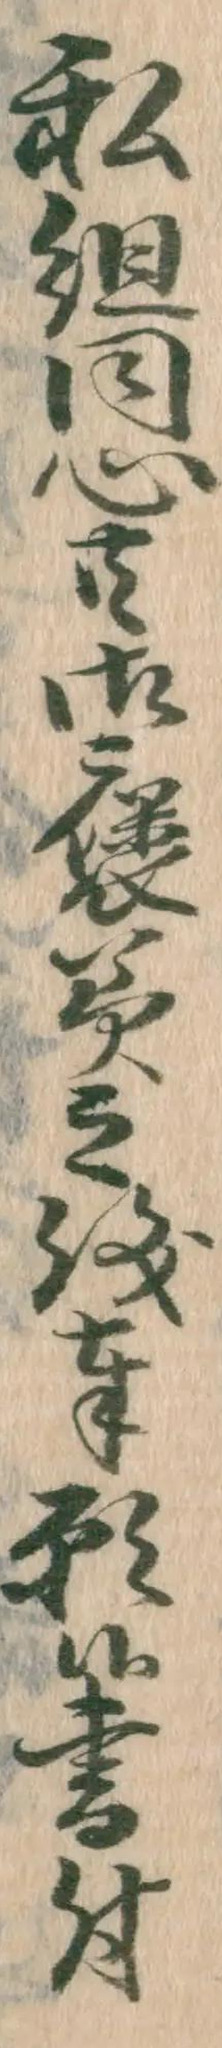│私組同心共御褒美之儀奉願候書付
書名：七十冊物類集 71巻. [44] 四十三 牢屋敷御普請御修覆地震ニ付骨折候牢屋掛御褒美之部
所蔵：国立国会図書館 National Diet Library, JAPAN
